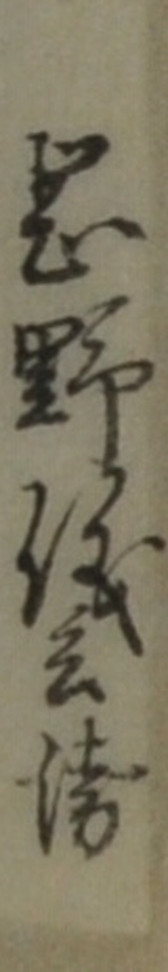岡野儀兵衛
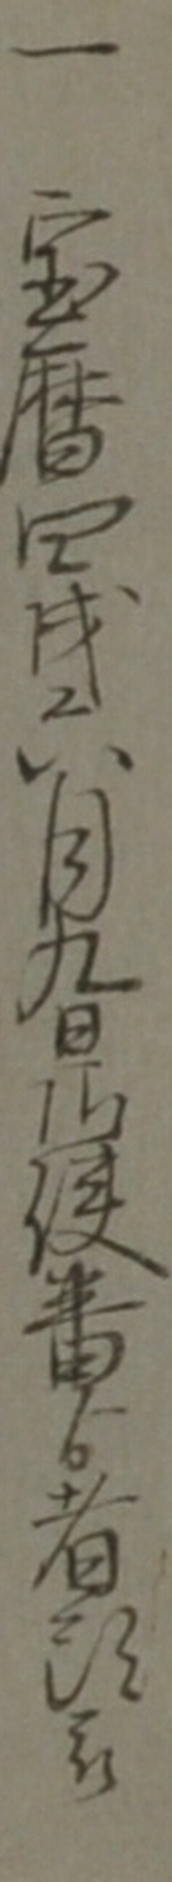一宝暦四戌六月九日御使番ゟ者頭被
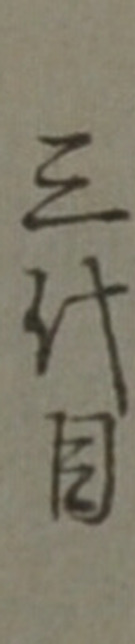三代目
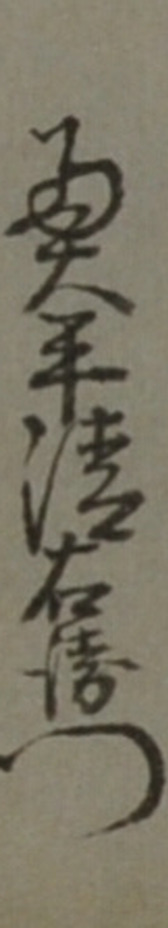奥平清右衛門
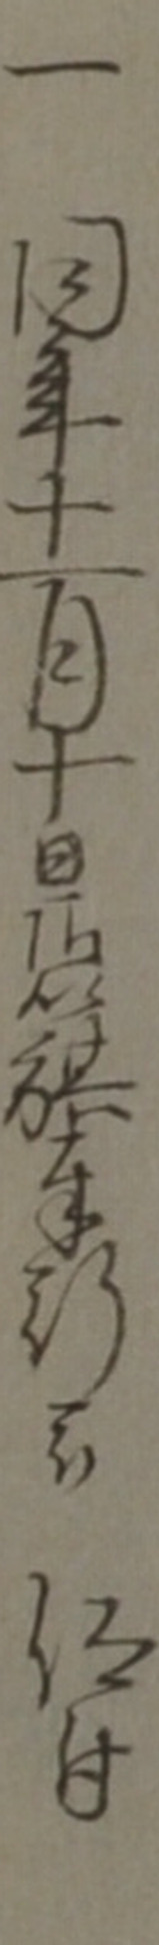一同年十一月十日御籏奉行被仰付
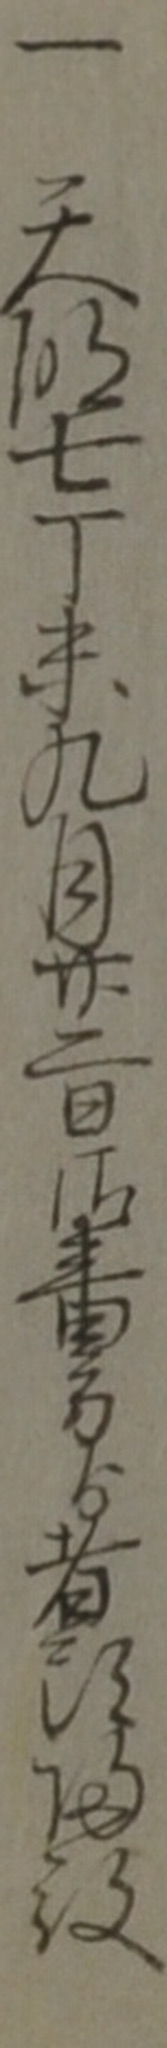一天明七丁未九月廿二日御番方ゟ者頭帰役
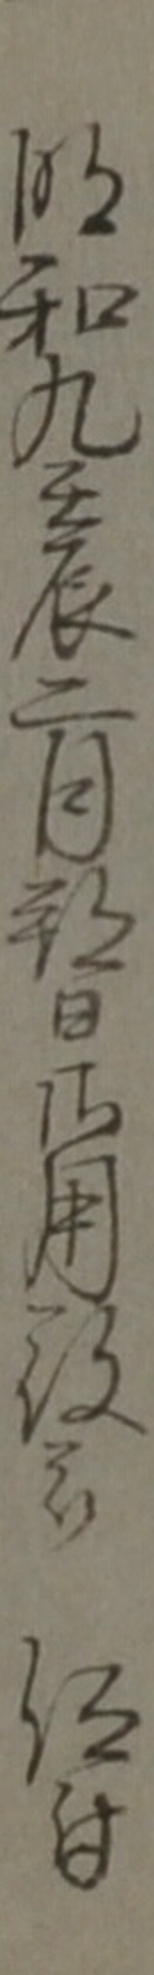一明和九壬辰二月朔日御用役被仰付
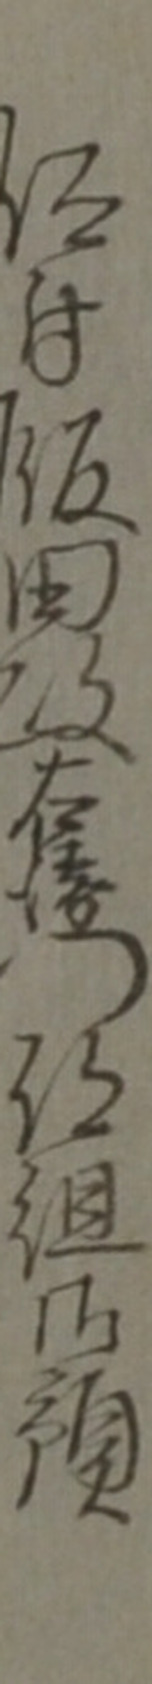仰付飯田政右衛門跡組御預
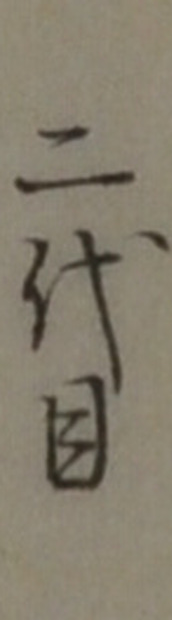二代目
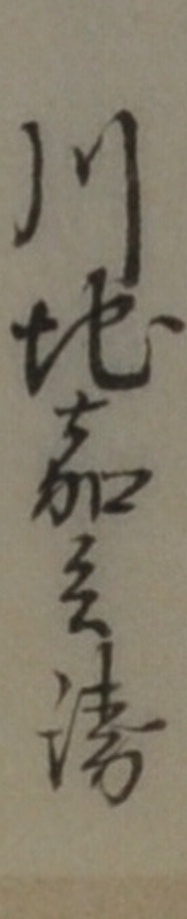川地嘉兵衛
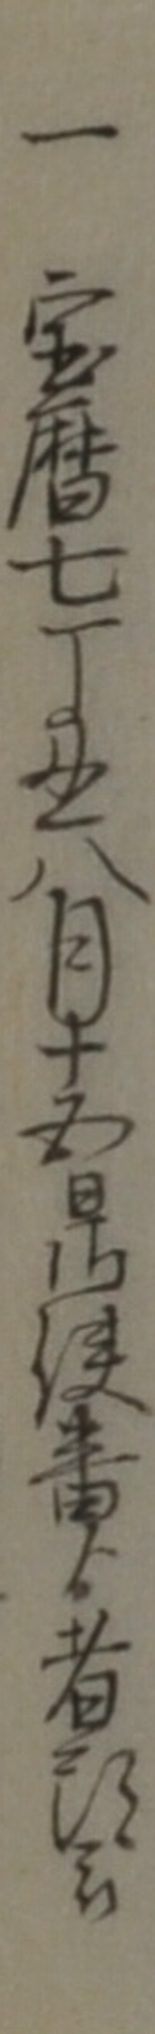一宝暦七丁丑八月十五日御使番ゟ者頭被
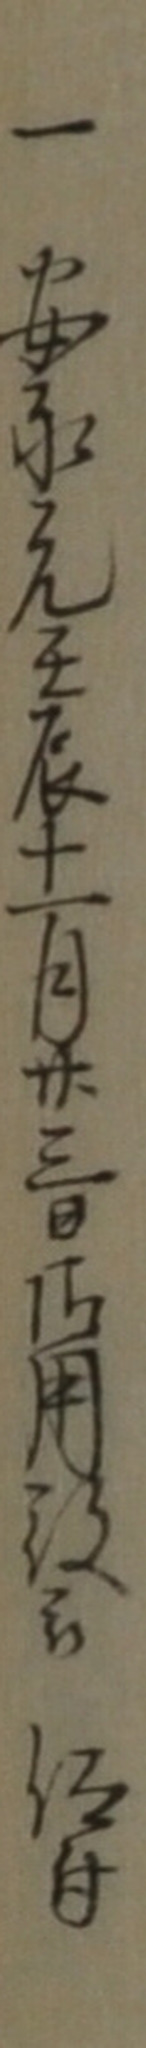一安永元壬辰十一月廿三日御用役被仰付
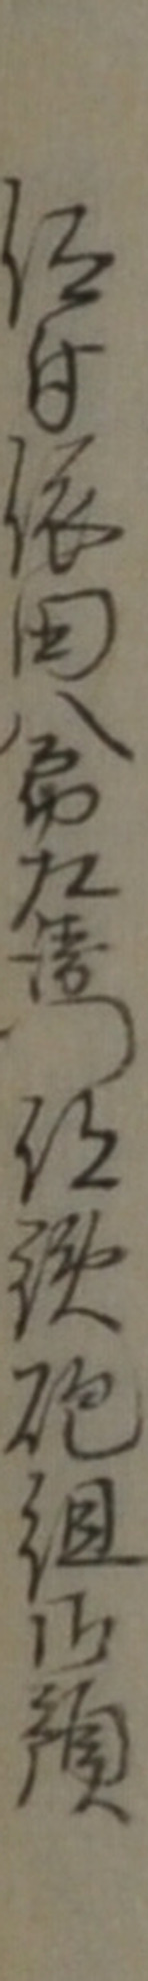仰付依田八郎左衛門跡鉄砲組御預
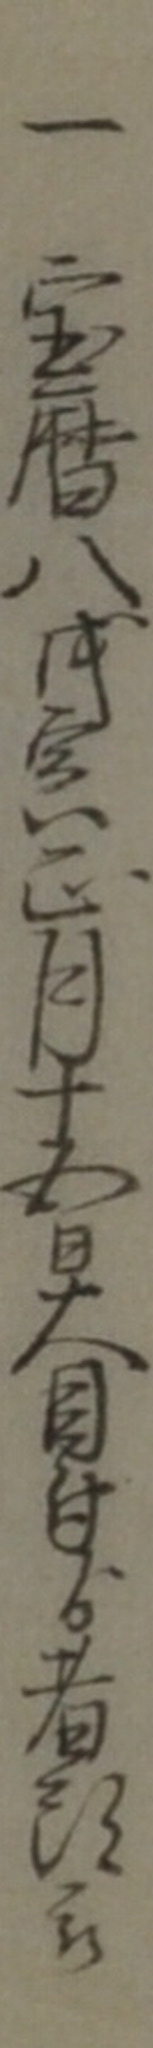一宝暦八戊寅正月十五日大目付ゟ者頭被
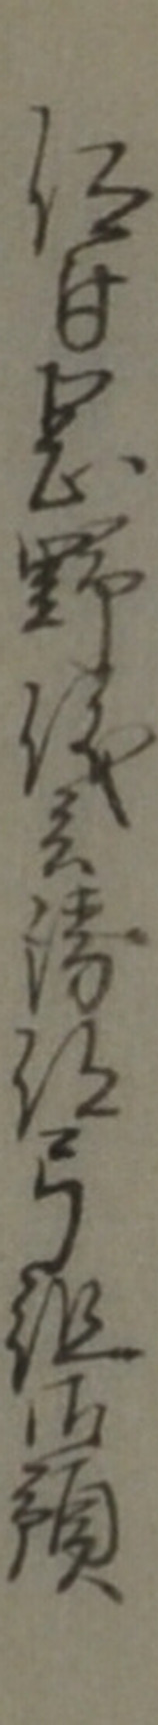仰付岡野儀兵衛跡弓組御預
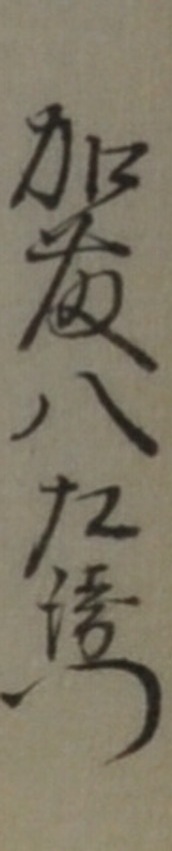加藤八左衛門
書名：諸御役代々録（二）
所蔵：伊那市立高遠町図書館・合同会社AMANE
